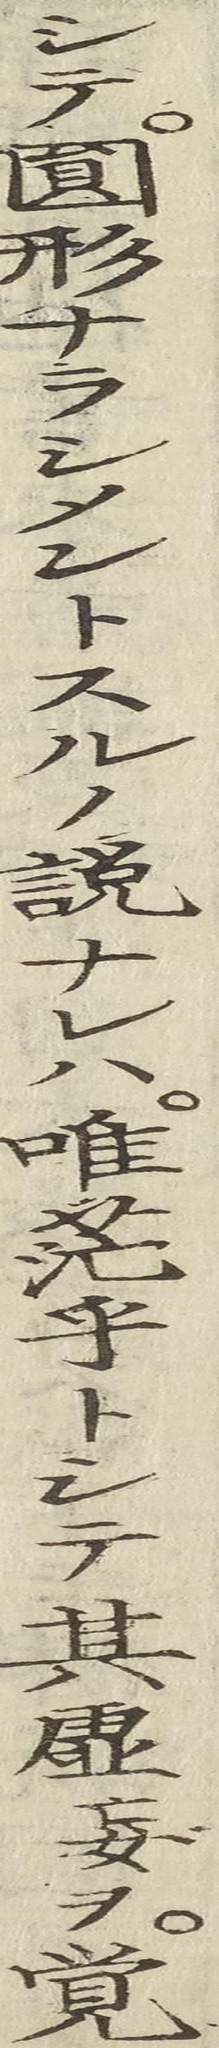シテ。円形ナラシメントスルノ説ナレハ。唯茫乎トシテ其虚妄ヲ。覚
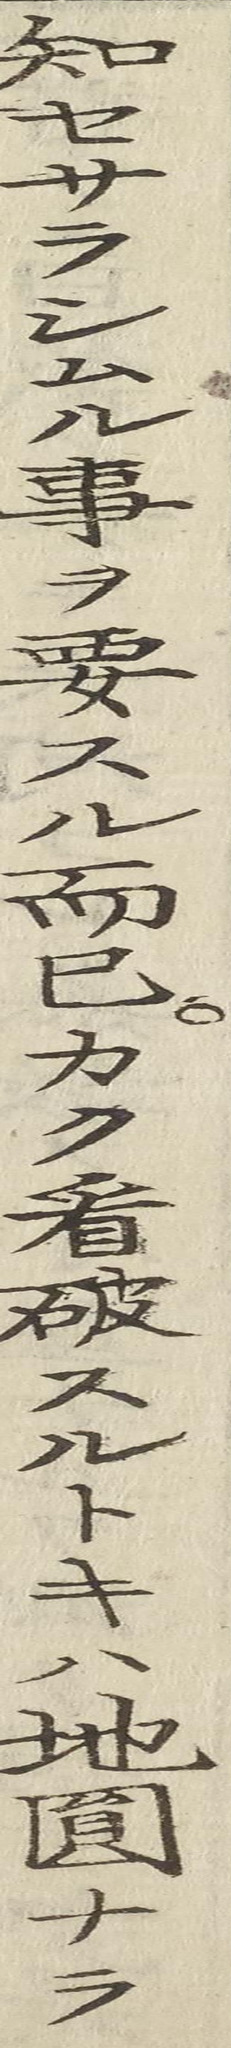知セサラシムル事ヲ要スル而已。カク看破スルトキハ地円ナラ
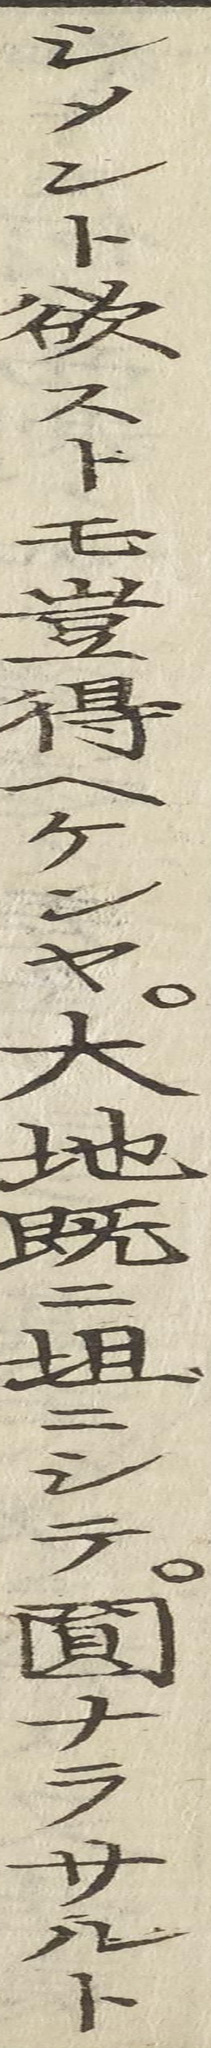シメント欲ストモ豈得ヘケンヤ。大地既ニ坥ニシテ。円ナラサルト
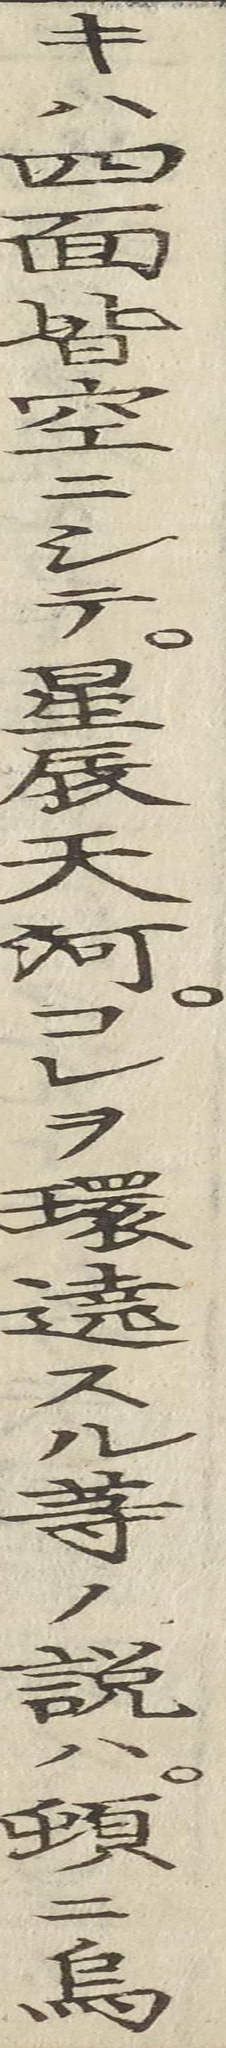キハ四面皆空ニシテ。星辰天河。コレヲ環遶スル等ノ説ハ。頓ニ烏
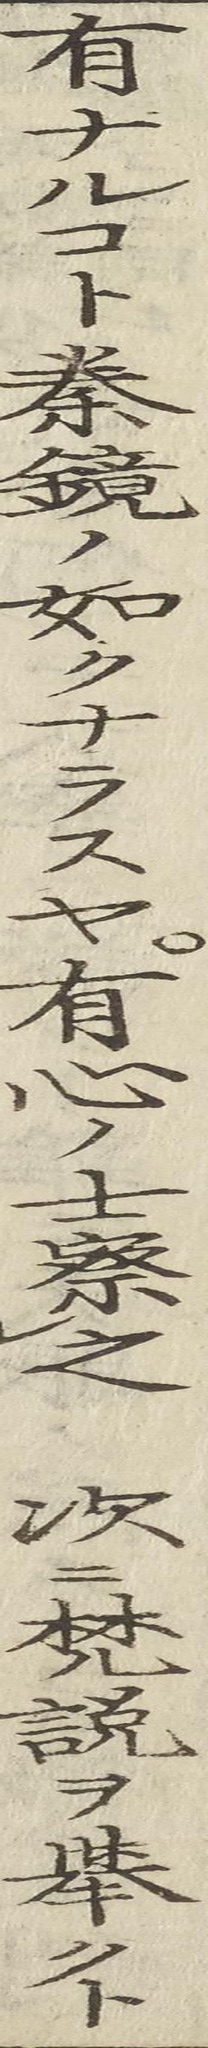有ナルコト秦鏡ノ如クナラスヤ。有心ノ士察之次ニ梵説ヲ挙クト
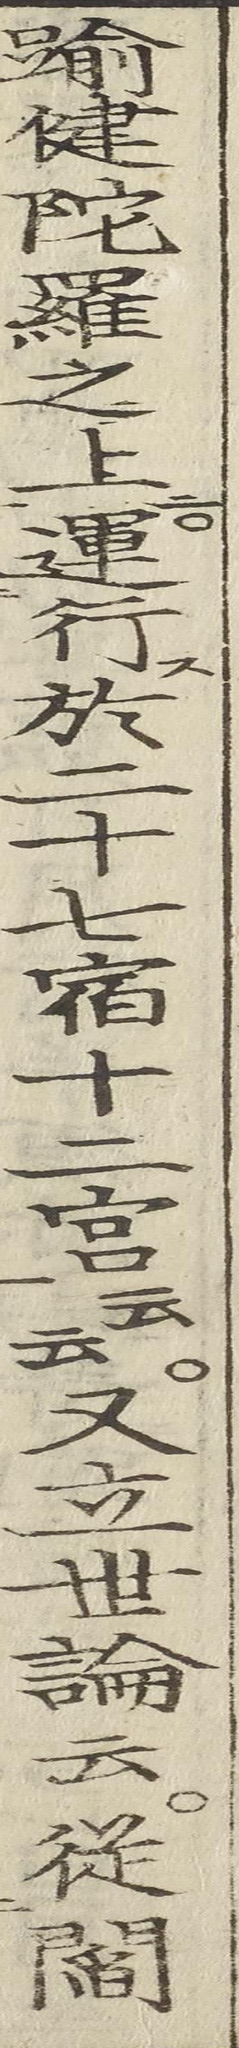踰健陀羅之上。運ニ行於二十七宿十二宮云云。又立世論云。従ニ閻

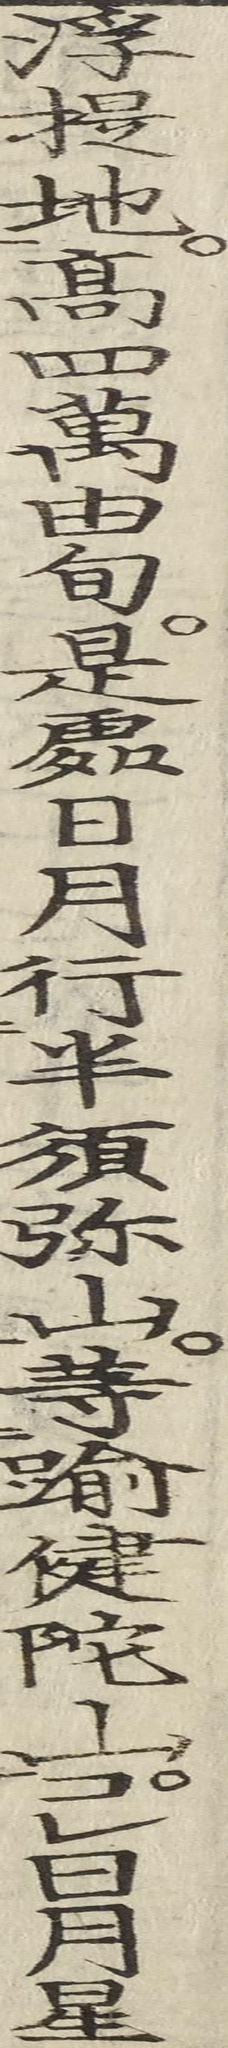浮提地。一高四万由旬。是処日月行ニ半須弥山。一等ニ踰健陀山。一コレ日月星
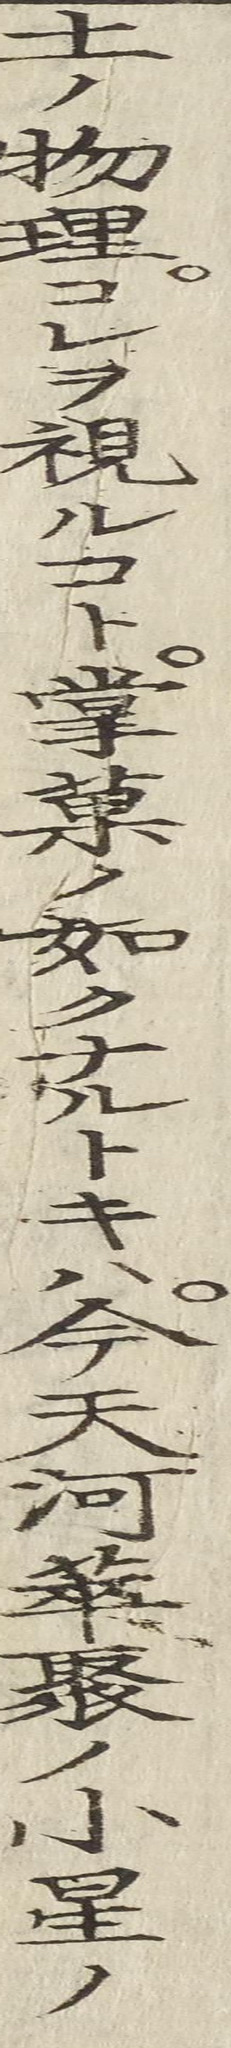土ノ物理。コレヲ視ルコト。掌菓ノ如クナルトキハ。今天河萃聚ノ小星ノ
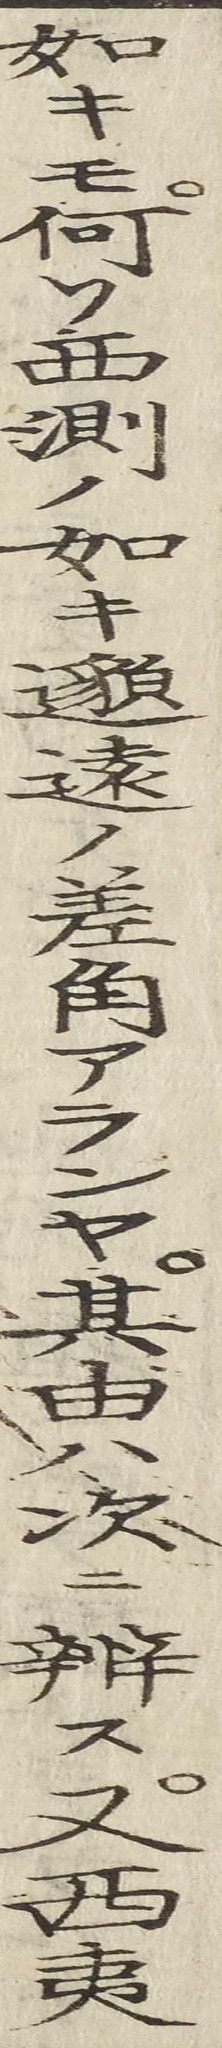如キモ。何ソ西測ノ如キ邈遠ノ差角アランヤ。其由ハ次ニ弁ス。又西夷
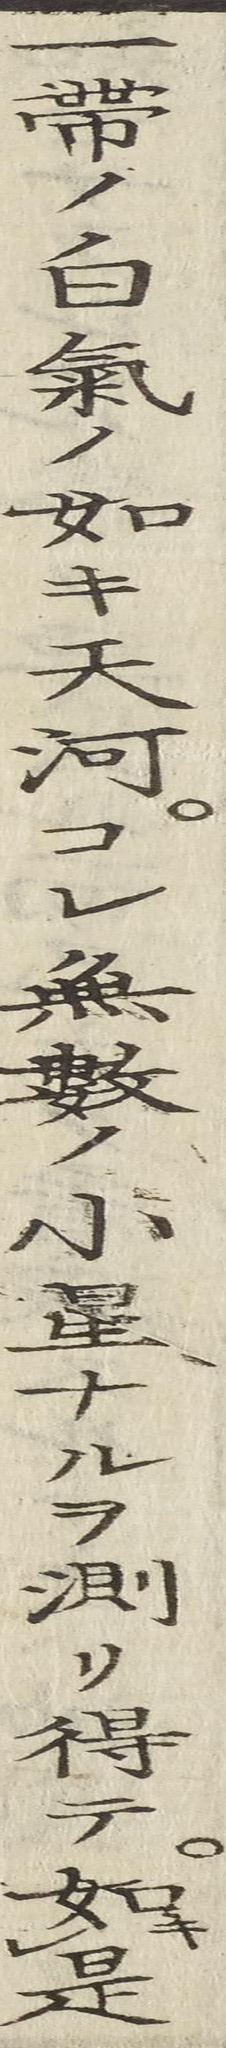一帯ノ白気ノ如キ天河。コレ無数ノ小星ナルヲ測リ得テ。如是
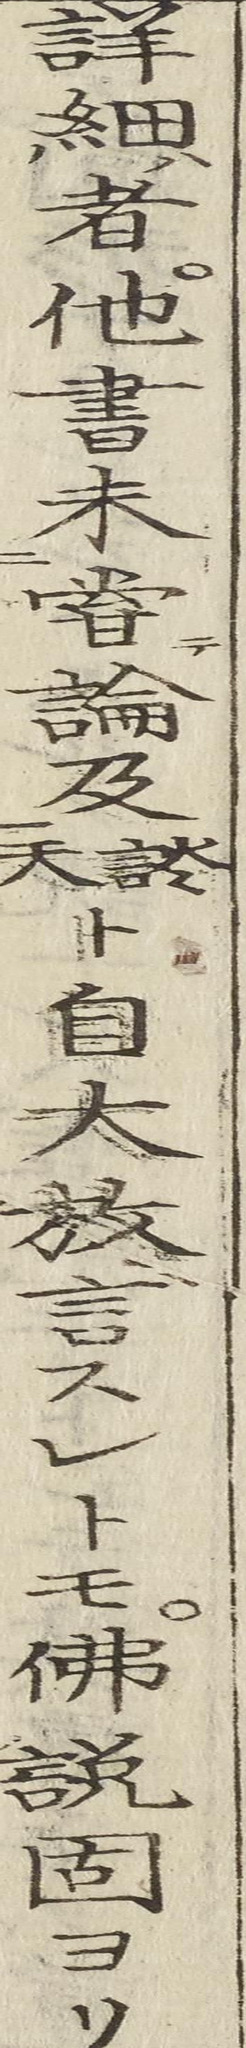詳細者。他書未ニ嘗論及證天ト自大放言スレトモ。仏説固ヨリ
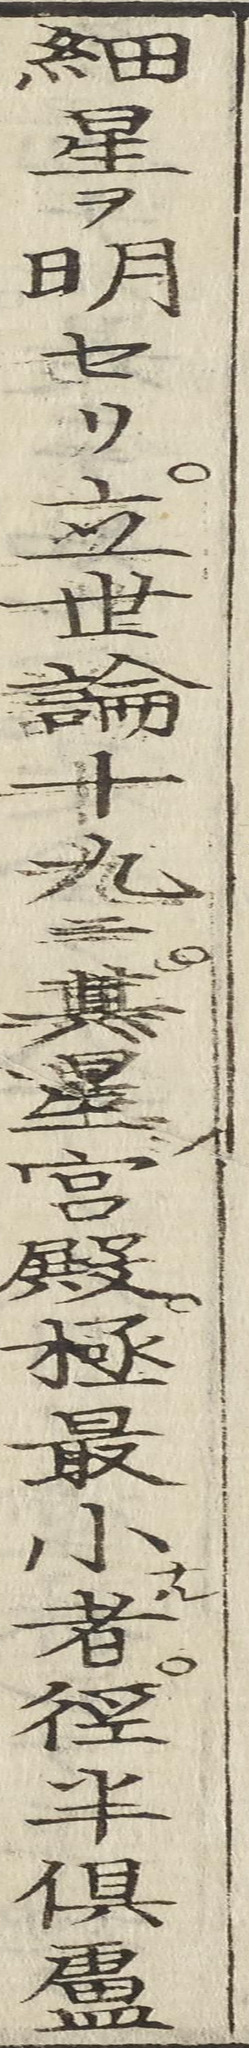細星ヲ明セリ。立世論十九ニ。其星宮殿。極最小者。径半俱盧
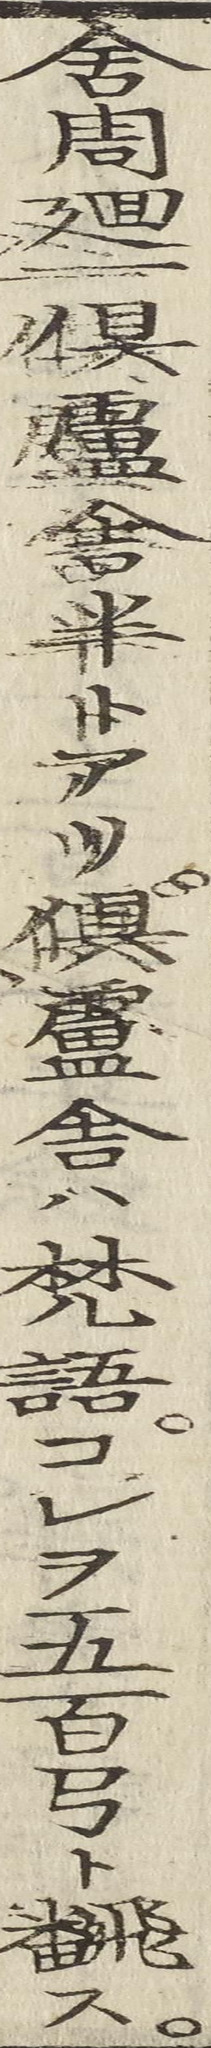舎周廻一俱盧舎半トアリ。俱盧舎ハ梵語。コレヲ五百弓ト飜ス。
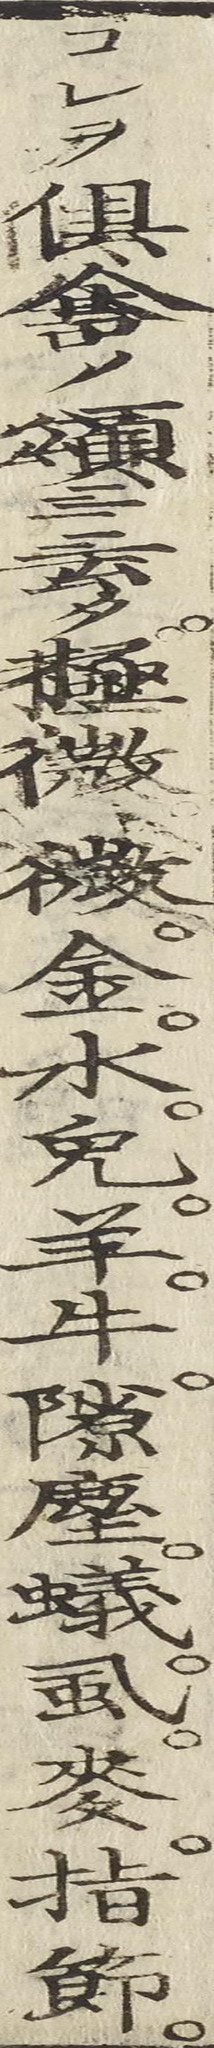コレヲ俱舎ノ頌ニ云タ。極微微。金。水。免。羊。牛。隙塵。蟻。虱。麦。指節。
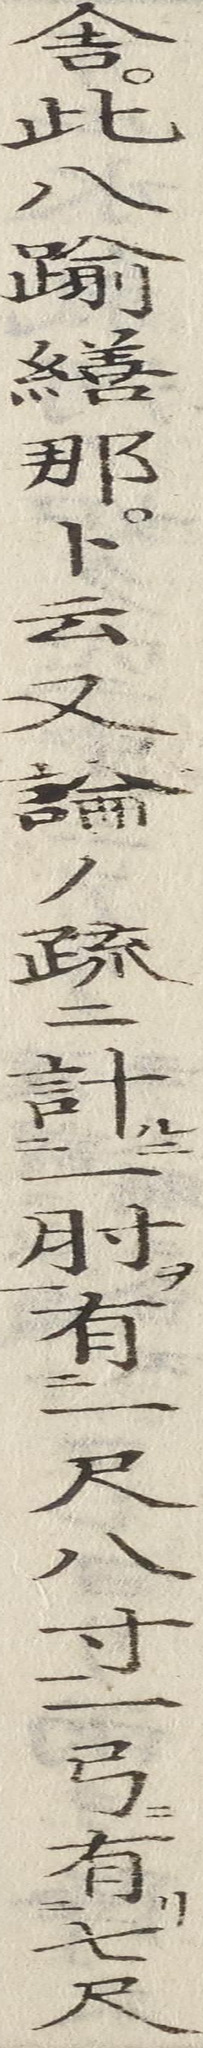舎。此八踰繥那。ト云又論ノ疏ニ計ニ一肘有ニ一尺八寸一弓有ニ七尺
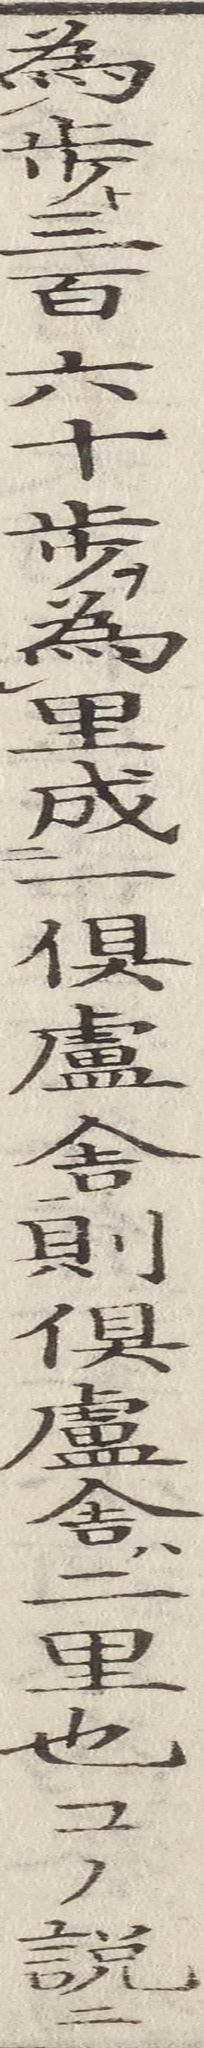為歩三百六十歩為里成ニ一俱盧舎則俱盧舎二里也コノ説ニ
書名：護法新論　二編　中
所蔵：東京大学地震研究所図書室 Earthquake Research Institute Library, The University of Tokyo, JAPAN
